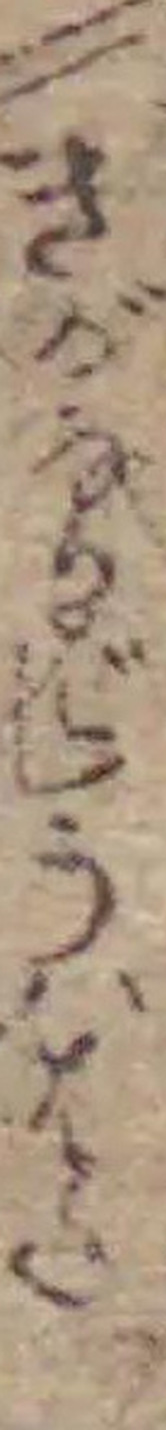きがなかばしうははた
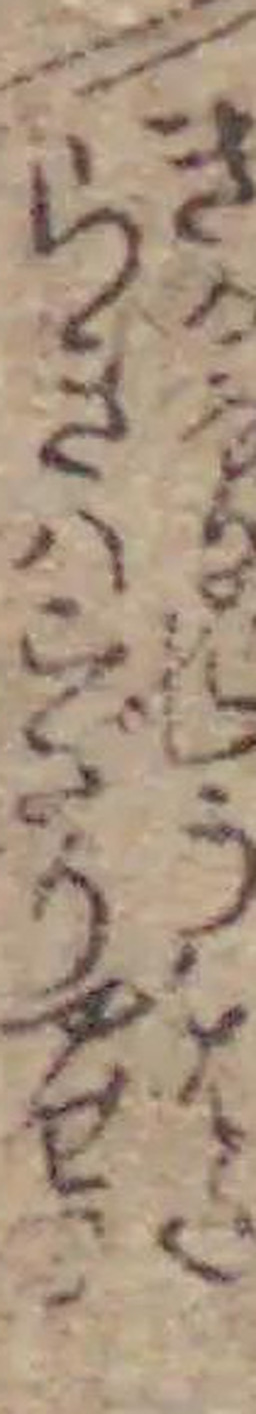らきはこざりやせ
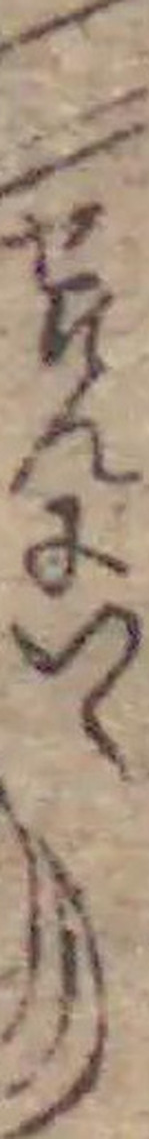せけんにいく
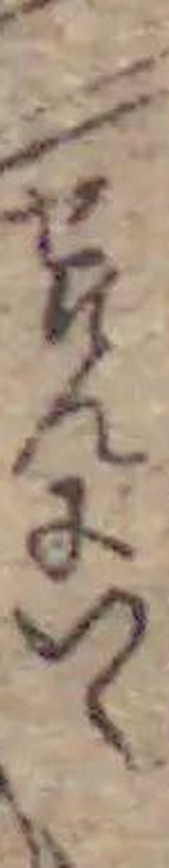せけんにいく
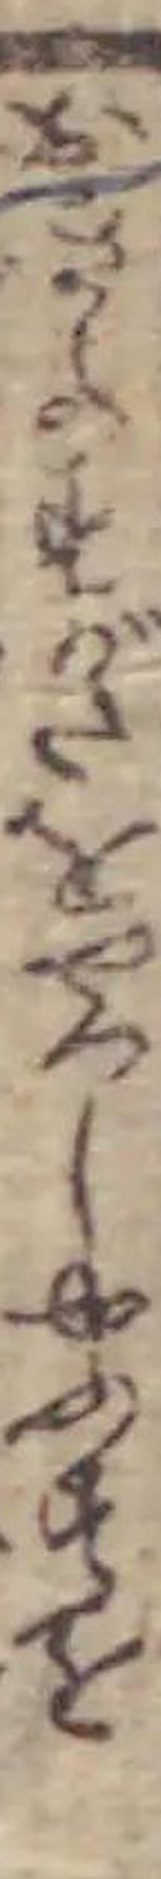おきよすがたをやつしやうすを
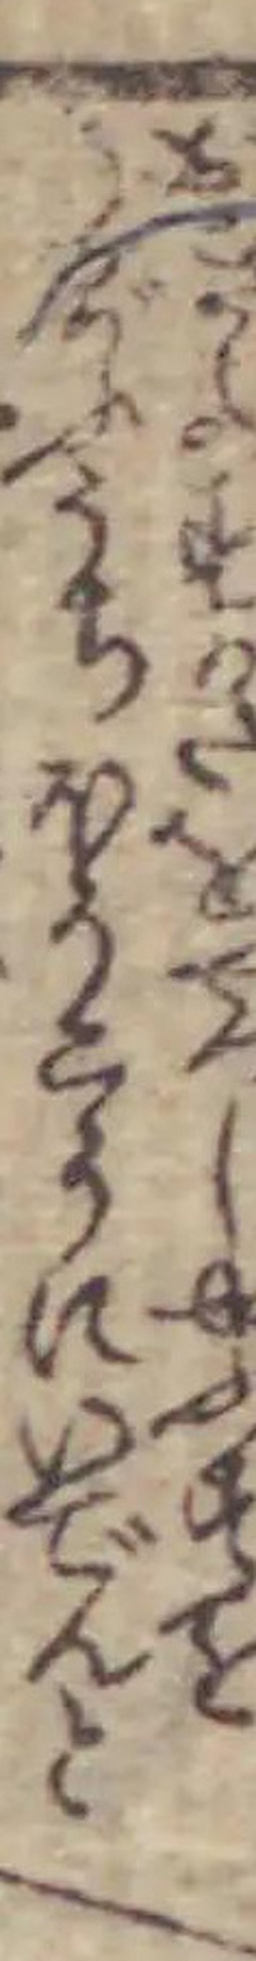うかがふうちほうこうにいでんと
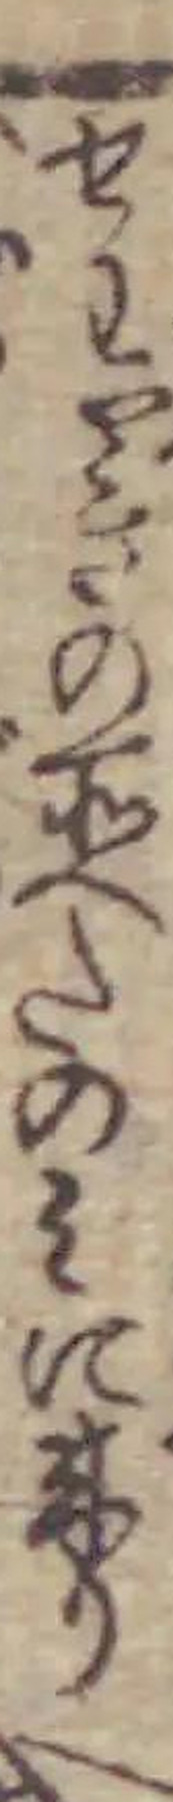せわやきの所へたのみに来り
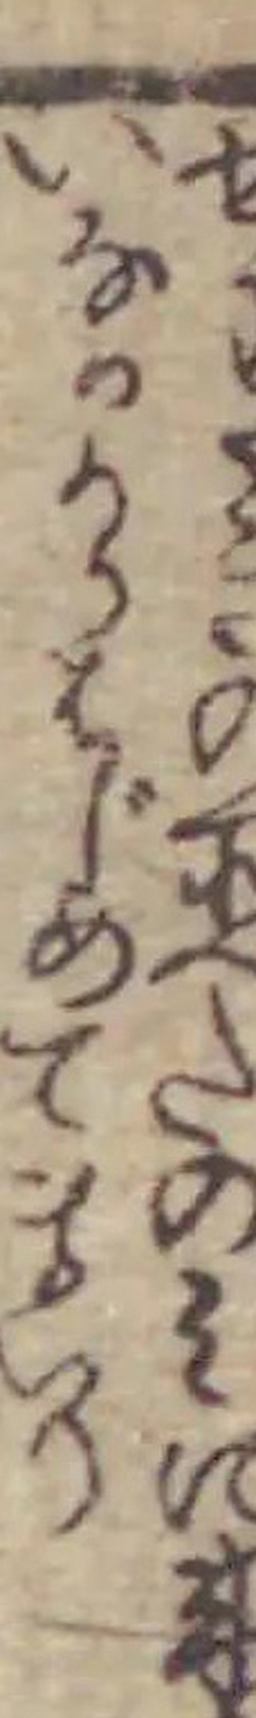いなかからはじめてまいり
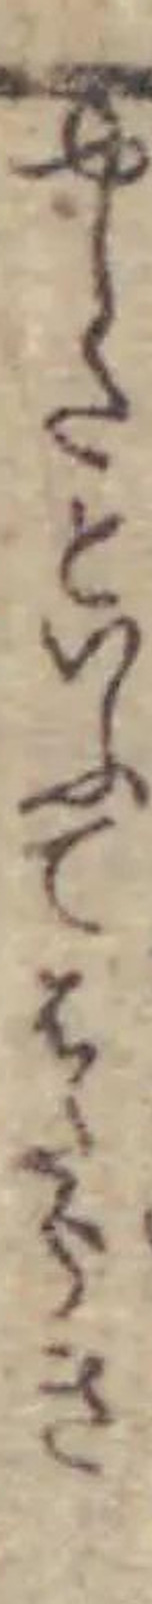やしたといふてはたらき
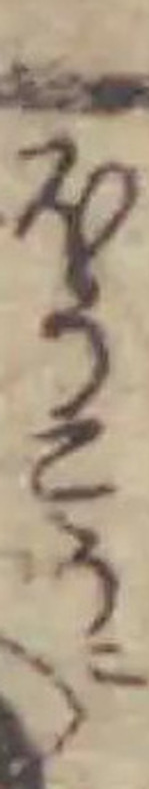ほうこうに
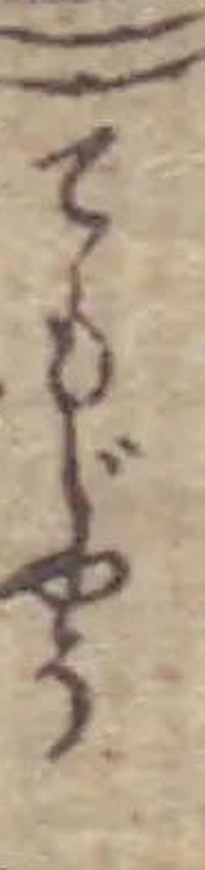てもじやう
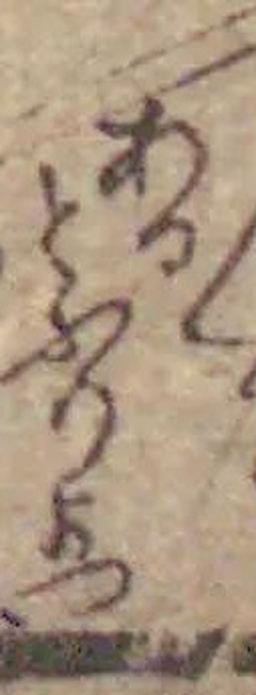とふりよつ
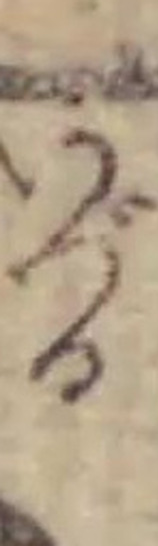いづる
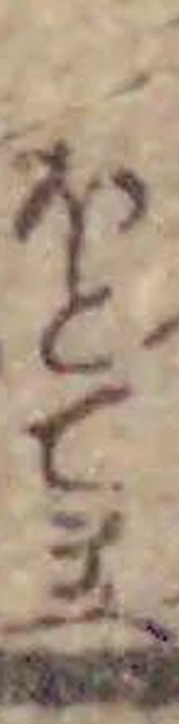ほとてまへ
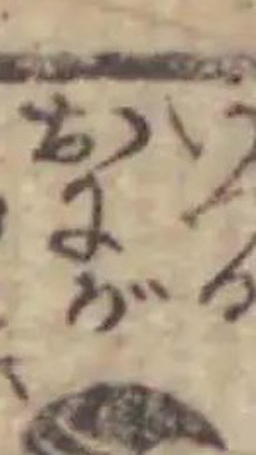おにが
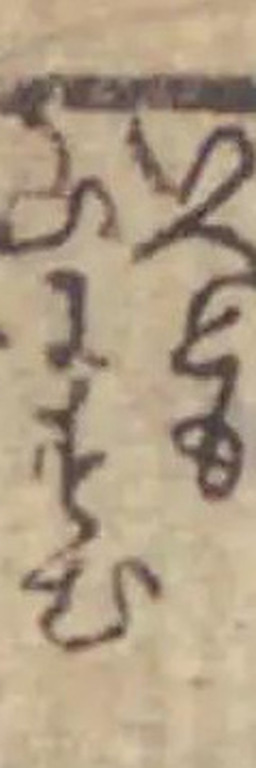山にすむ
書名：桃太郎元服姿 2巻
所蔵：国立国会図書館 National Diet Library, JAPAN
